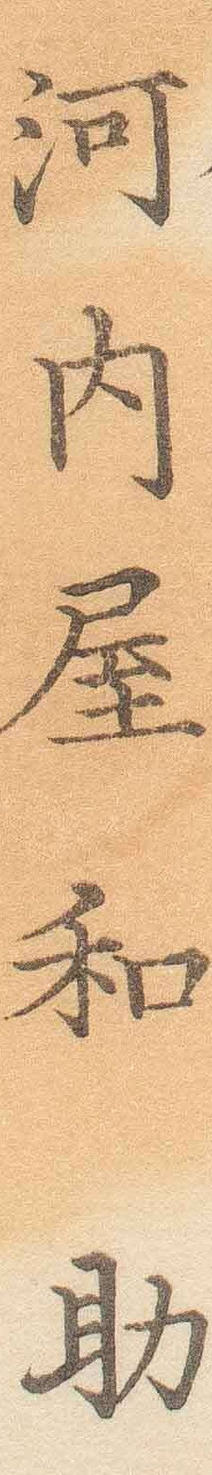河内屋和助
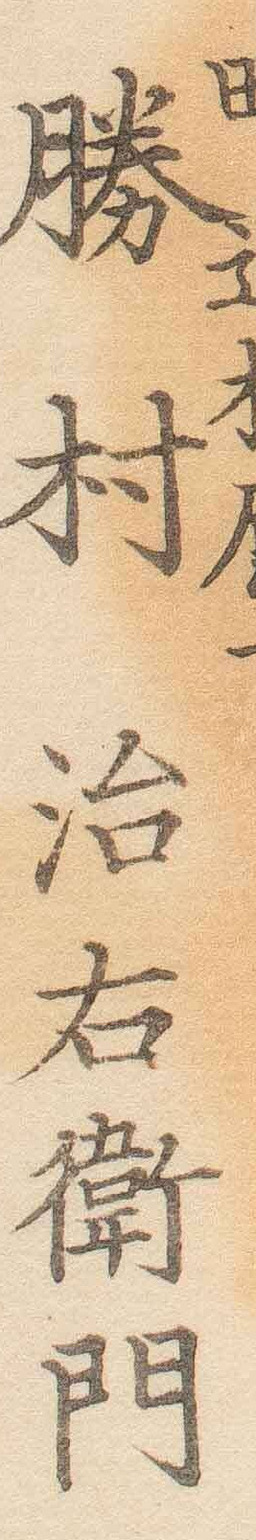勝村治右衛門
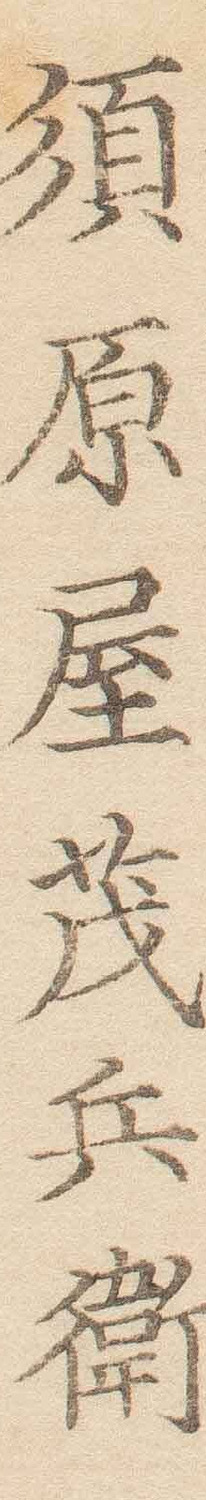須原屋茂兵衛
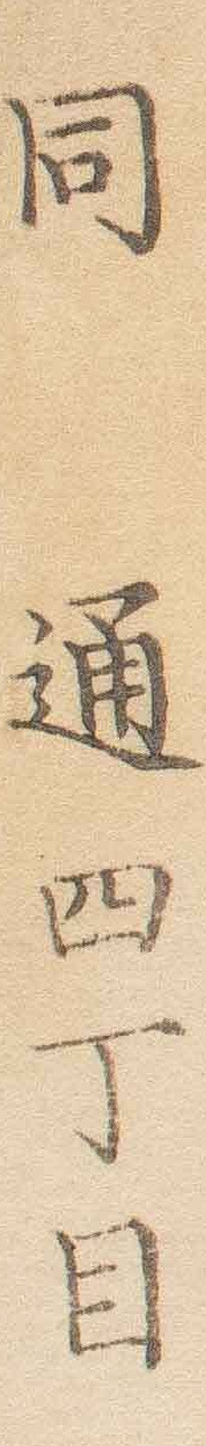同通四丁目
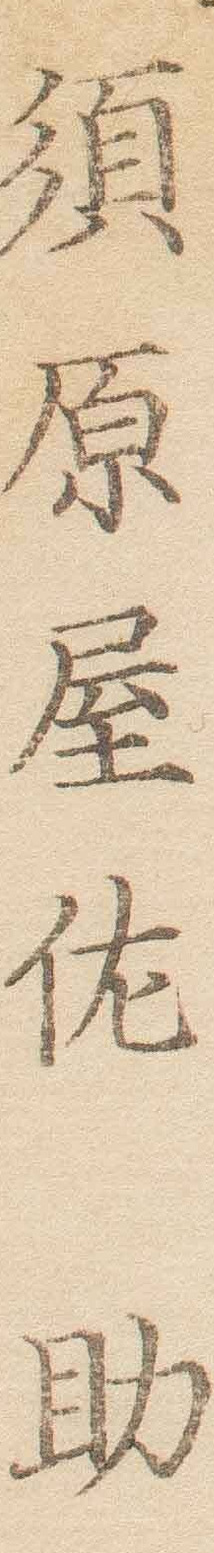須原屋佐助
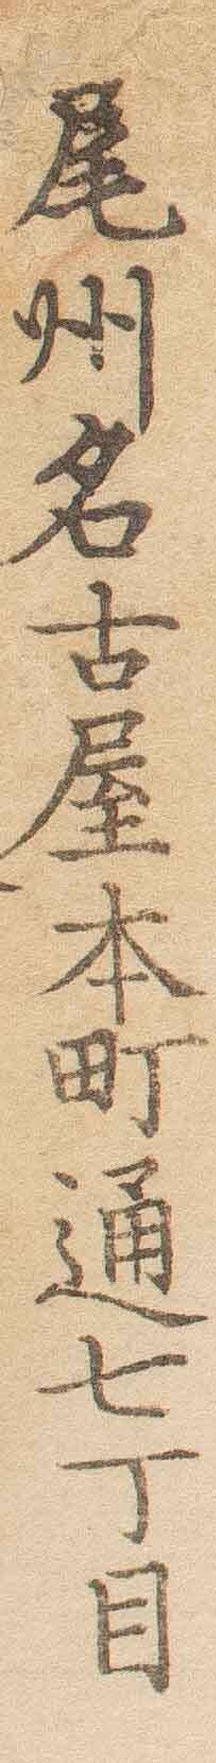尾州名古屋本町通七丁目
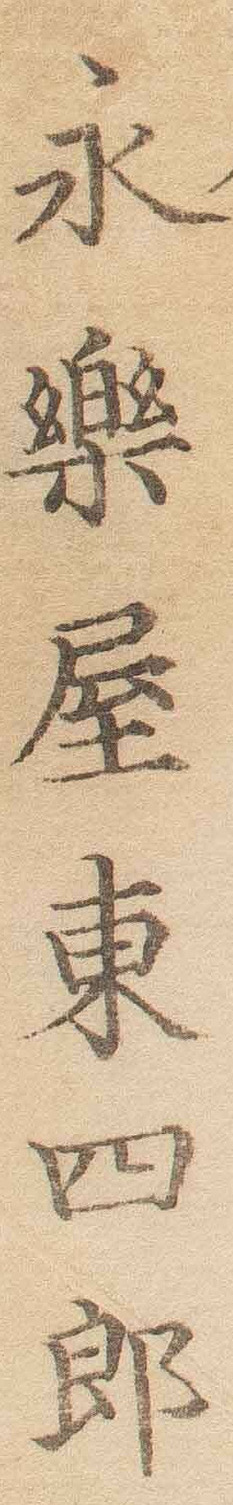永楽屋東四郎
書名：国郡全図
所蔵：東京学芸大学附属図書館 国文学研究資料館
